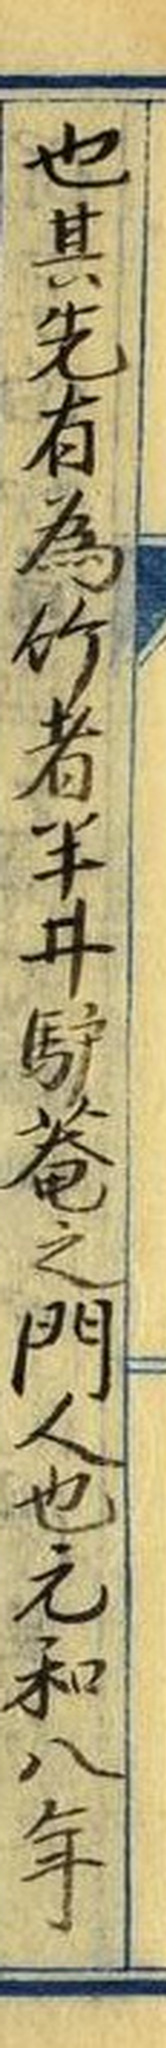也其先有為竹者半井馿菴之門人也元和八年
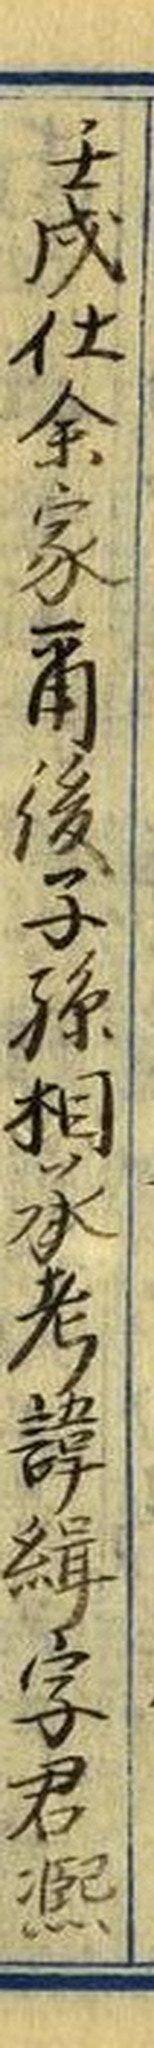壬戌仕余家再後子孫相承考諱緝字君凞
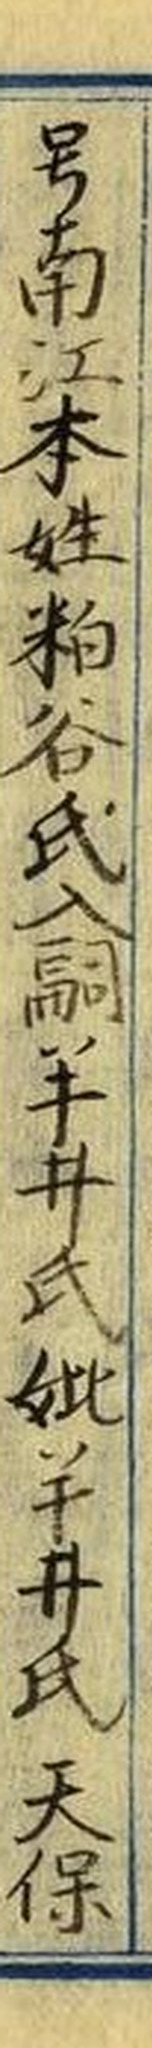号南江本姓粕谷氏入嗣半井氏妣半井氏天保
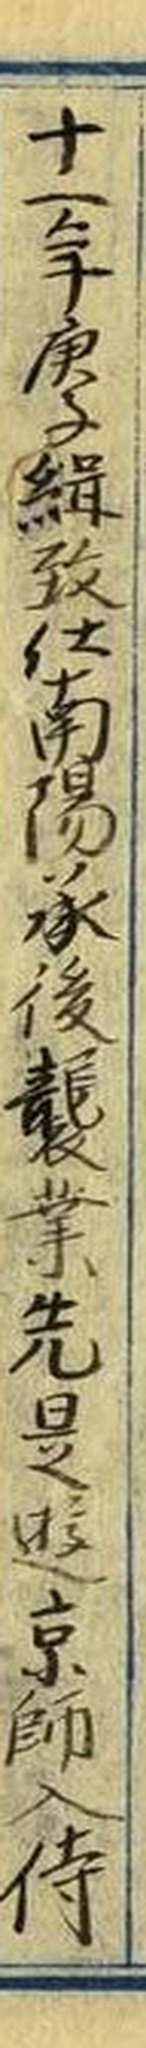十一年庚子緝致仕南陽承後襲業先是游京師入侍
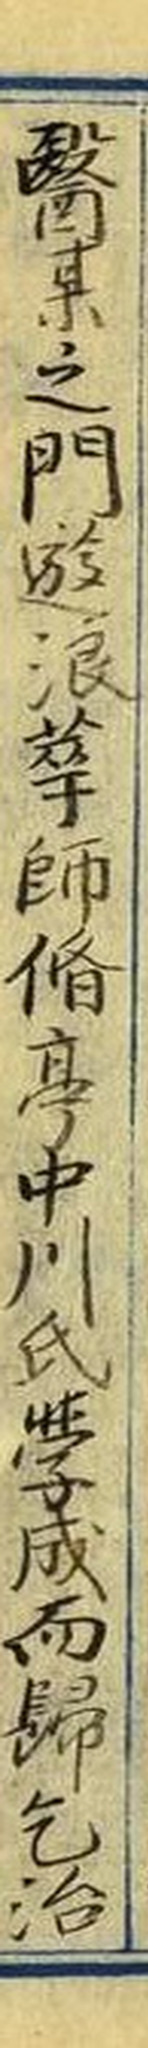醫某之門遊浪蕐師脩亭中川氏學成而歸乞治
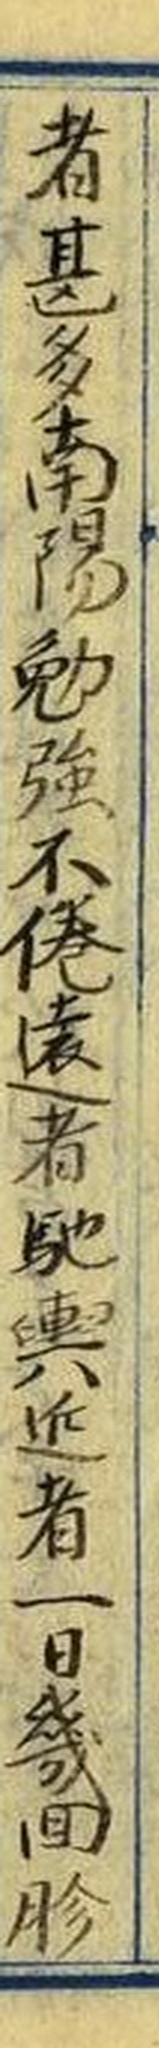者甚多南陽勉強不倦遠者馳輿近者一日幾囬胗
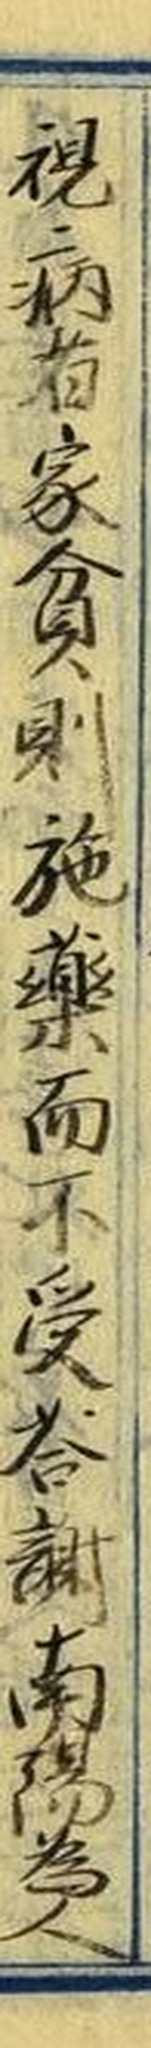視病者家貧則施藥而不受荅謝南陽為人
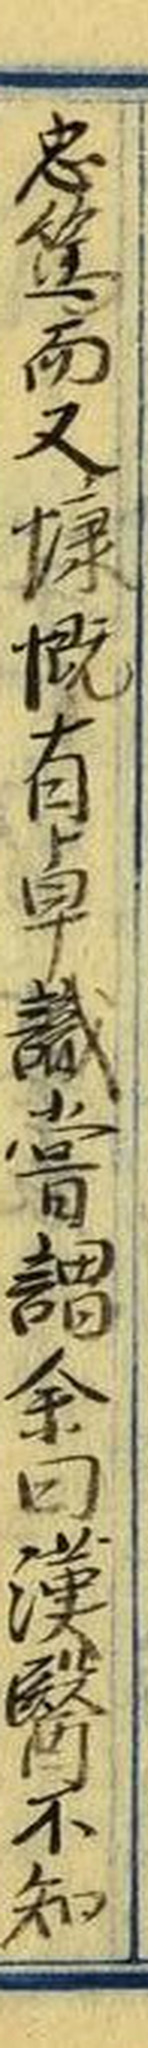忠篤而又慷慨有卓識甞謂余曰漢醫不知
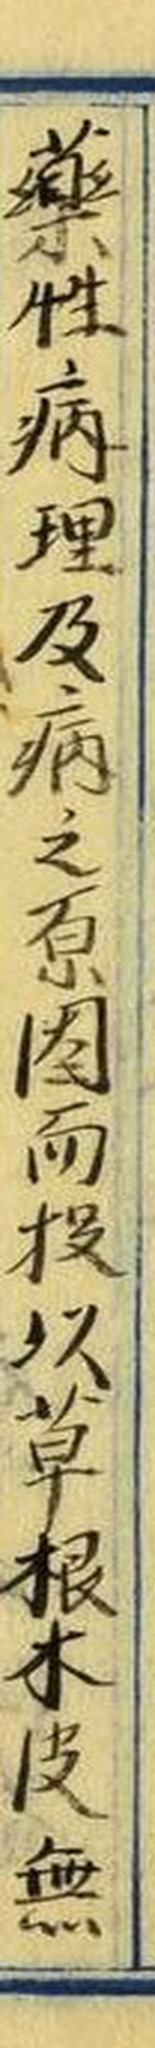藥性病理及病之原因而投以草根木皮無
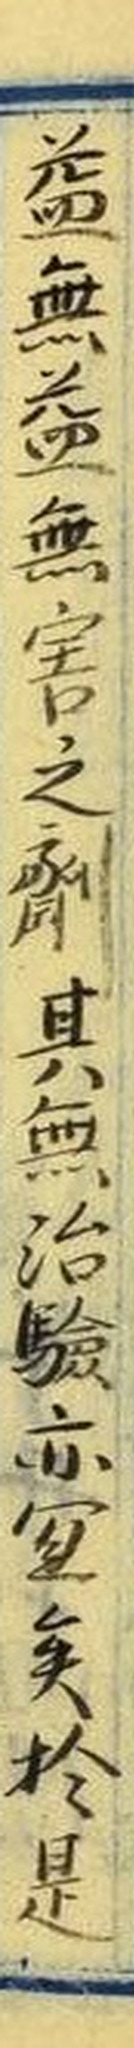益無益無害之劑其無治験亦宜矣於是
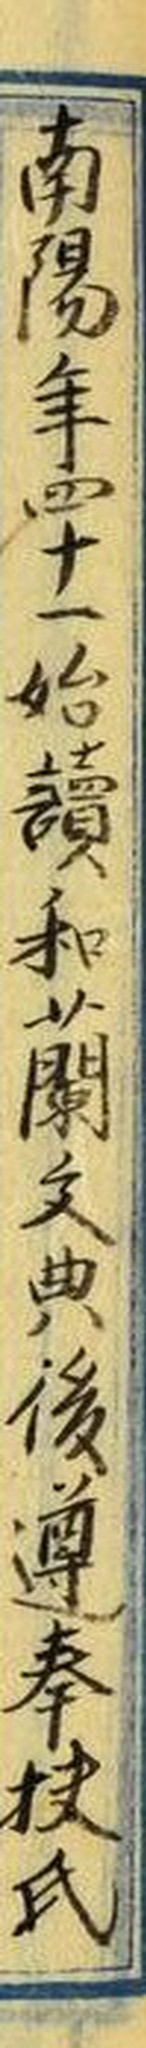南陽年四十一始讀和蘭文典後遵奉扶氏
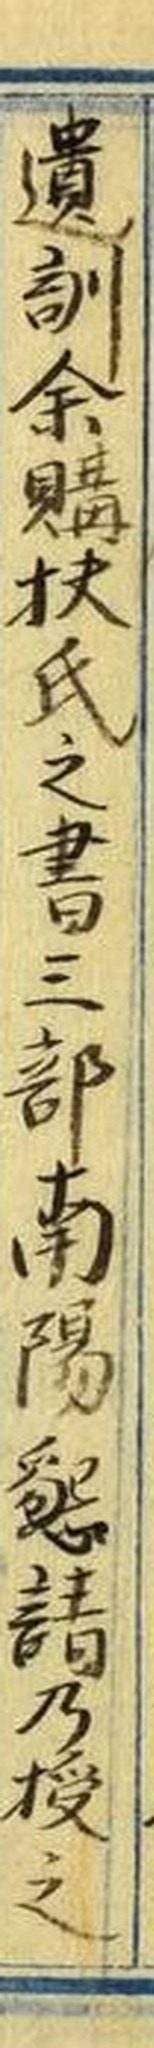遺訓余購扶氏之書三部南陽懇請之授之
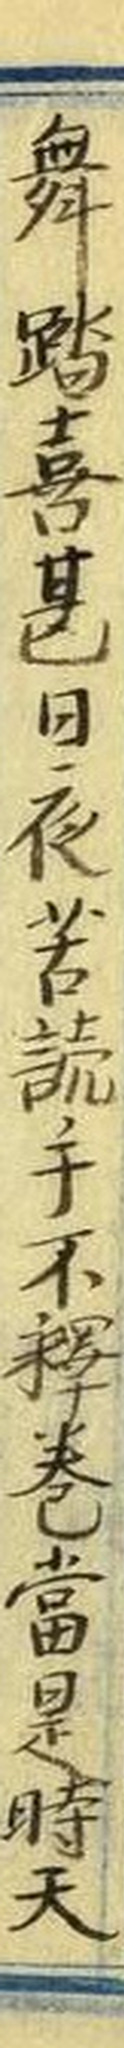舞踏喜甚日夜苦讀手不釋巻當是時天
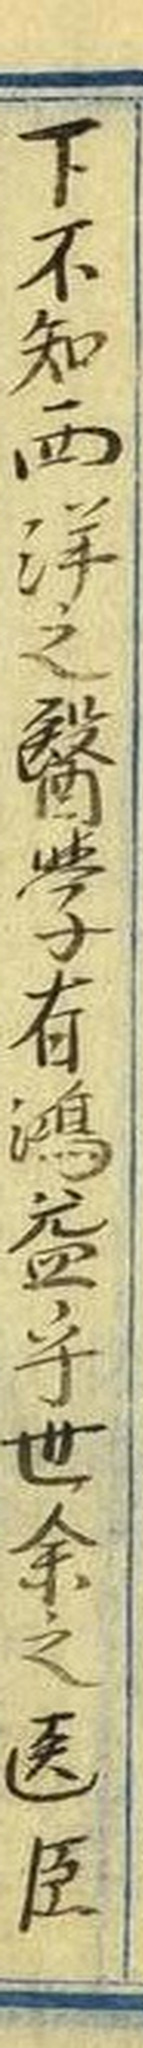下不知西洋之醫學有鴻益乎世余之医臣
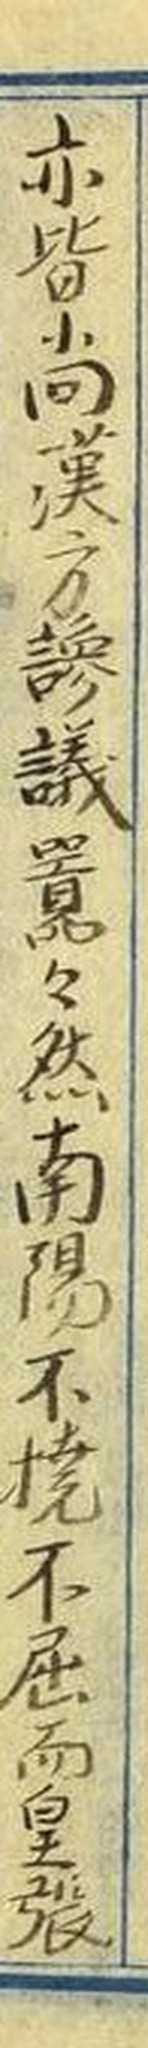亦皆尚漢方謲議囂々然南陽不撓不屈皇張
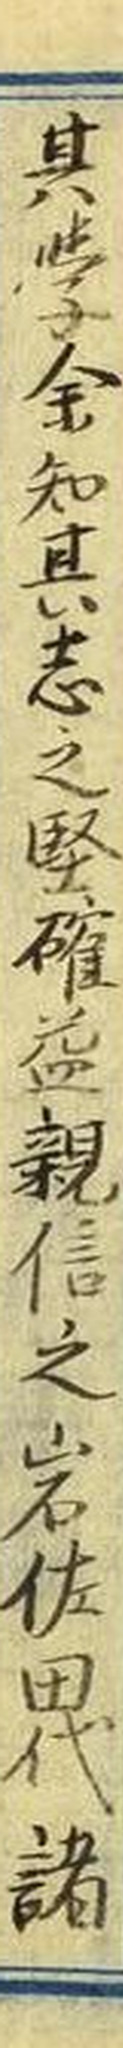其學余知其志之堅確益親信之岩佐田代諸
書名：温古集 四巻
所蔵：福井県文書館 Fukui Prefectural Archives
